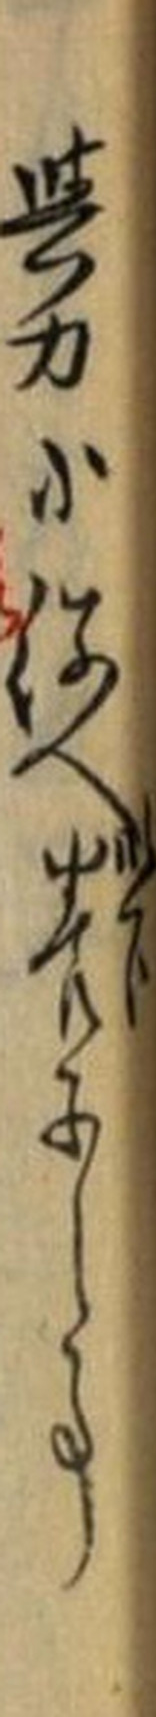与力小役人養子之事
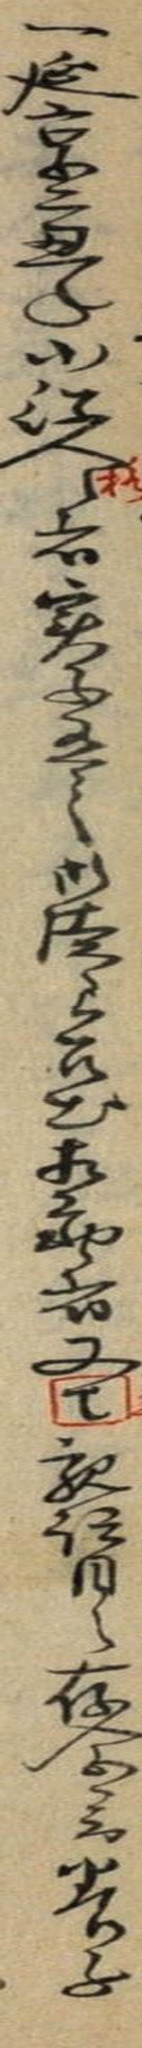一延享二丑年小役人之者実子有之御徒被召出相勤候者又は親跡目之存念に而養子
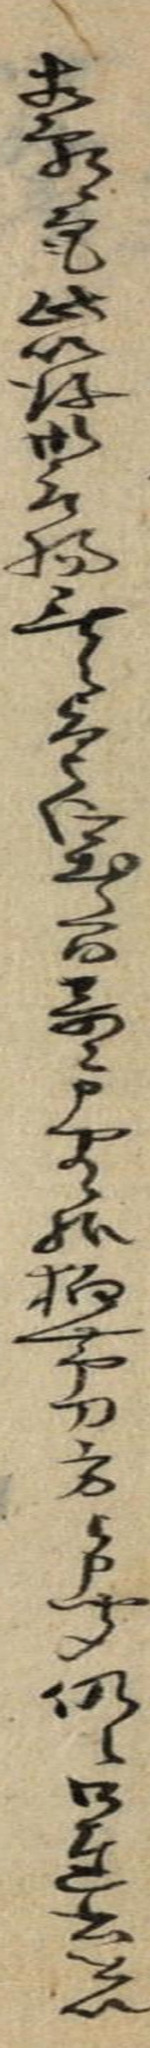相願候而も此以後御取揚無之旨被仰出候間寄々申聞候様柏帯刀方被申聞仍之口達書を以
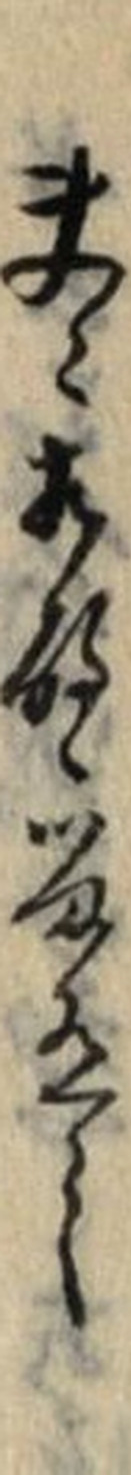夫々相触候留有之
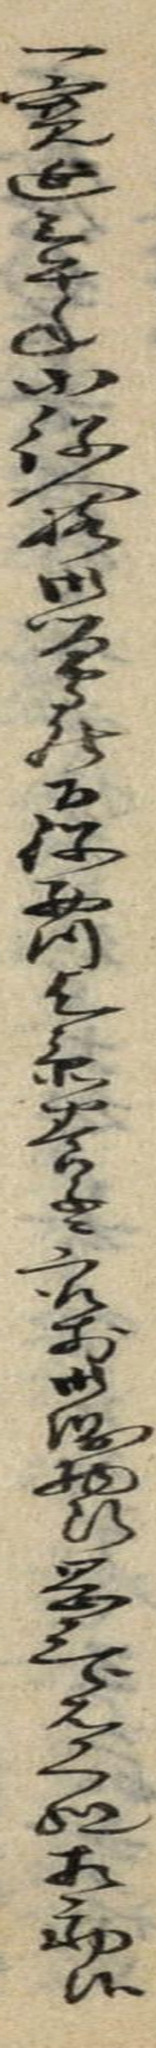一寛延三午年小役人格御留守居下役西川与兵衛養子に最前御側物頭岡三郎右衛門組相勤候
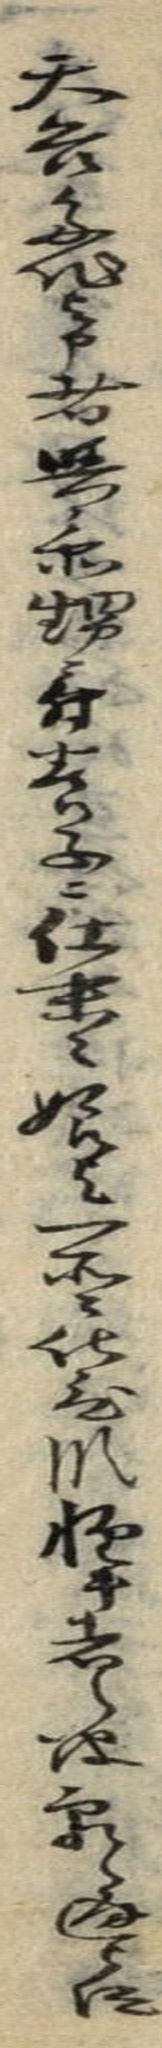天谷多作と申者与兵衛甥に付養子に仕末々娘と一所に仕度段軽き者之儀願之通被仰
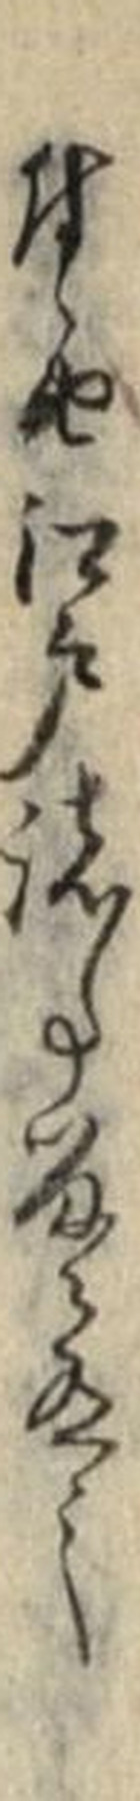付候由江戸諸事留に有之
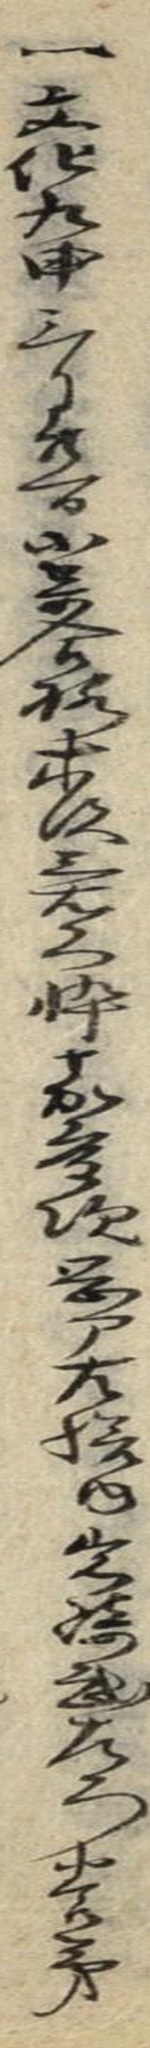一文化九申三月廿一日小寄合格木沢三右衛門悴嘉藤次岡部左膳内岩崎武左衛門養弟
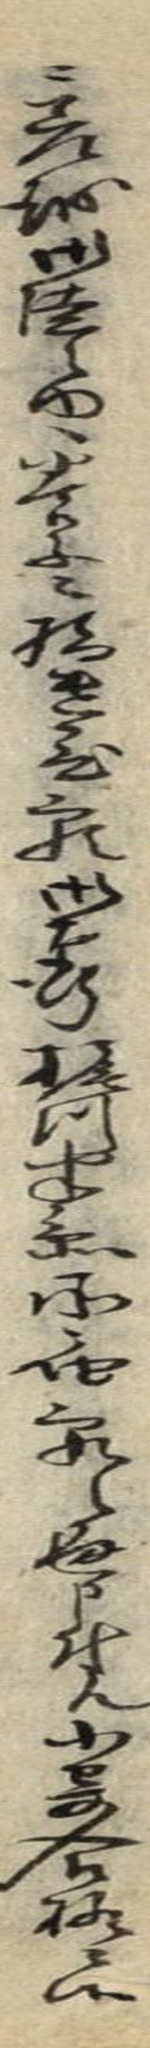に差越御徒之内へ養子に指遣度願御奉行梶川半兵衛承届願之通申付る小寄合格に候
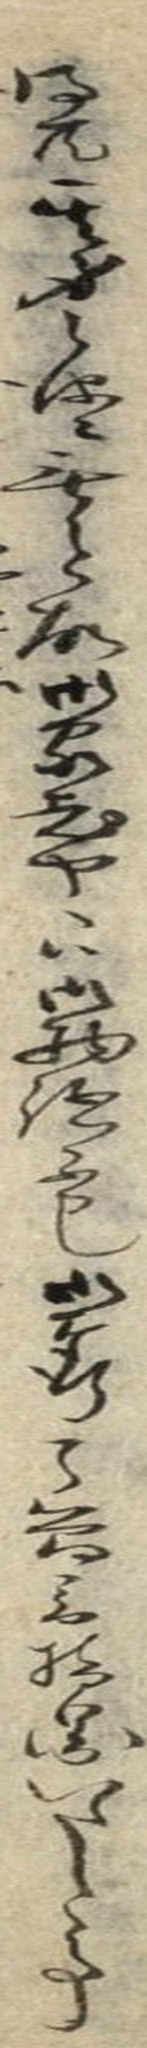得共其身之儀に無之候故御家老中へは御物語不申候御奉行了簡に而指図いたし候事
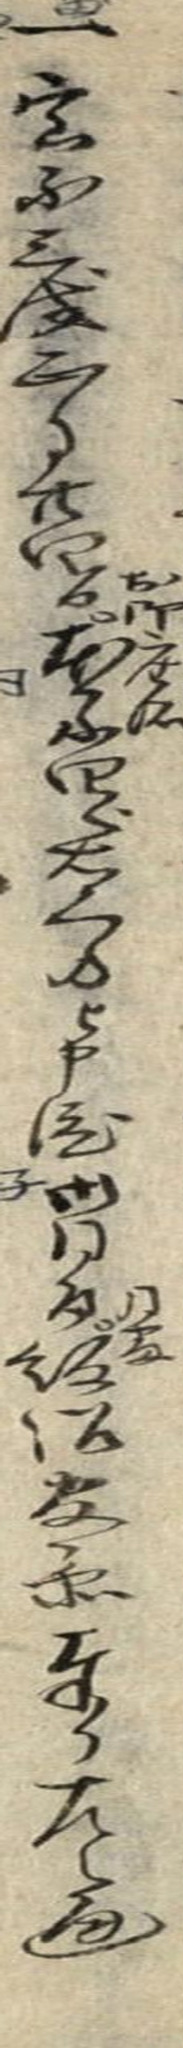一宝永三戌正月廿四日◦於御座所本多四郎右衛門方被申渡御目付◦月番飯沼勘兵衛承候左之通
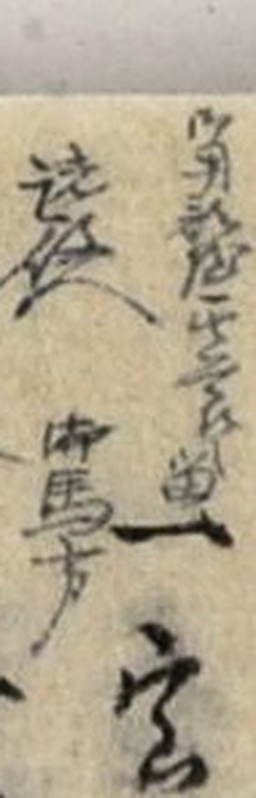諸役人御馬方
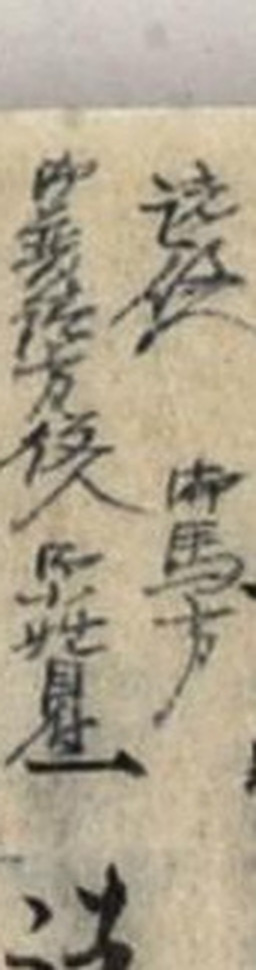御普請方役人御小姓目付
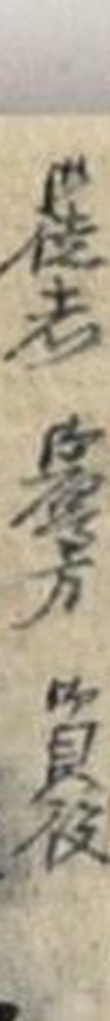御徒者御鷹方御貝役
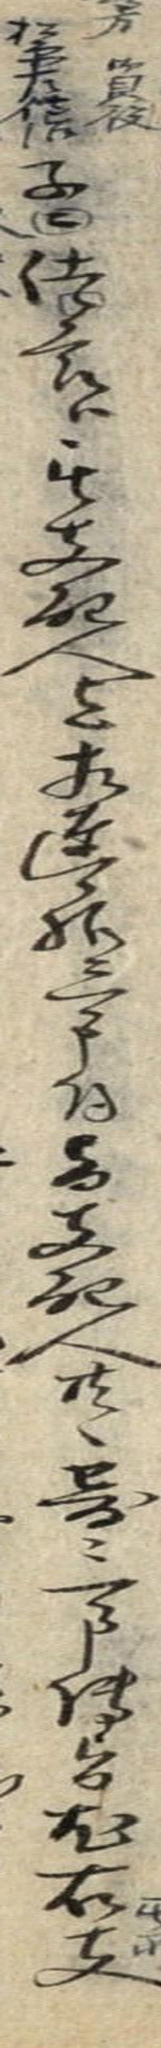子に仕候節は其支配人迄相達候様に可申付旨支配人共へ寄々可申伝旨尤右支
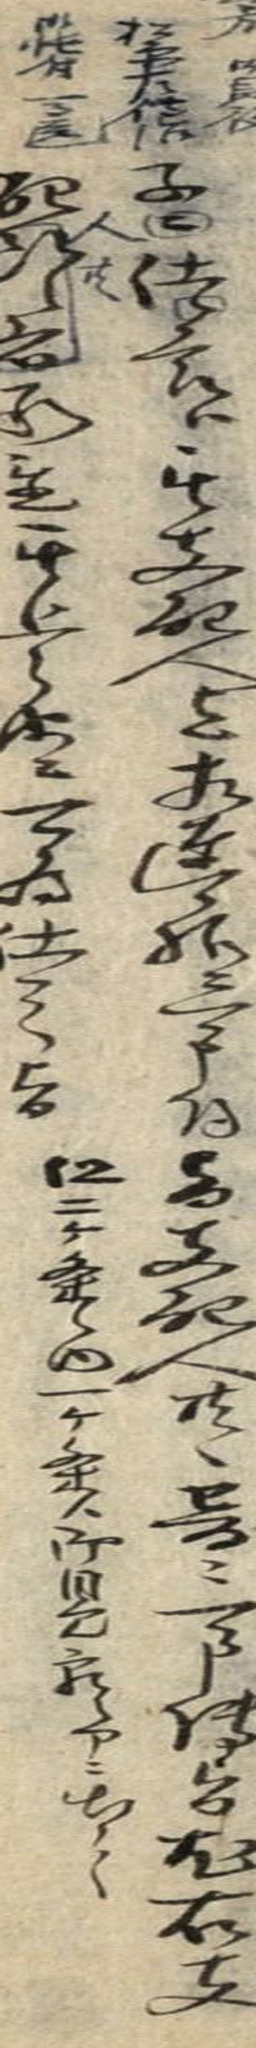配頭之者承置其上之儀に可為仕之旨但二ヶ条之内一ヶ条は御目見願之部に出之
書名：養子縁組之部
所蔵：福井県文書館 Fukui Prefectural Archives
